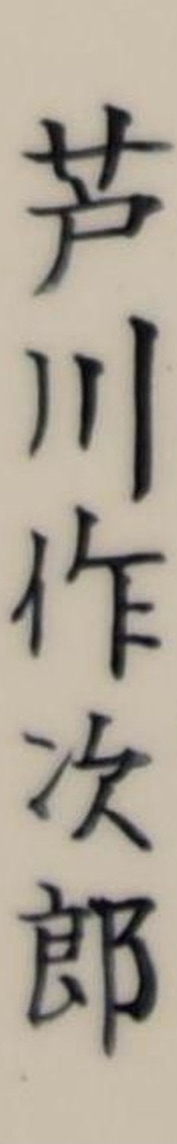芦川作次郎
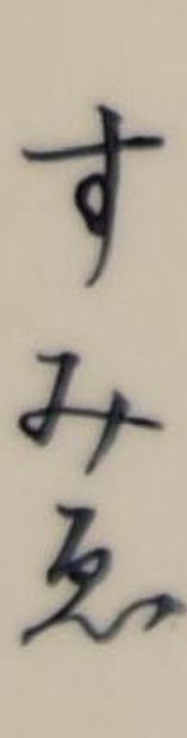すみゑ
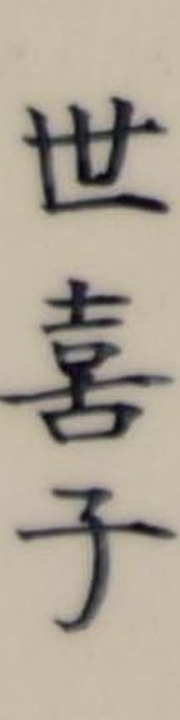世喜子
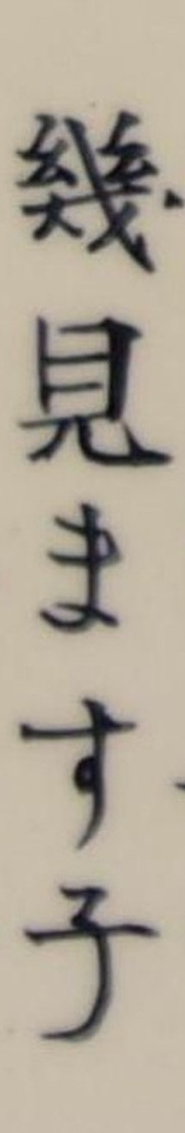幾見ます子
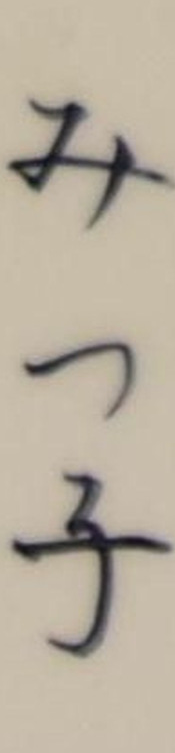みつ子
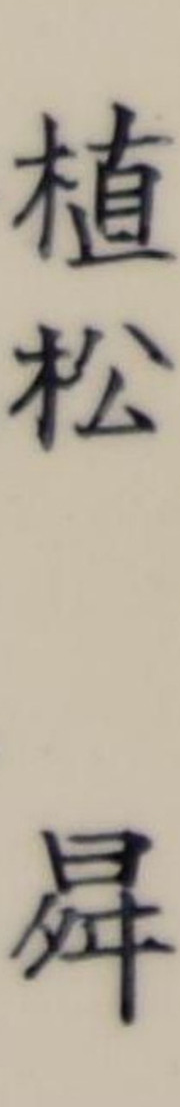植松昇
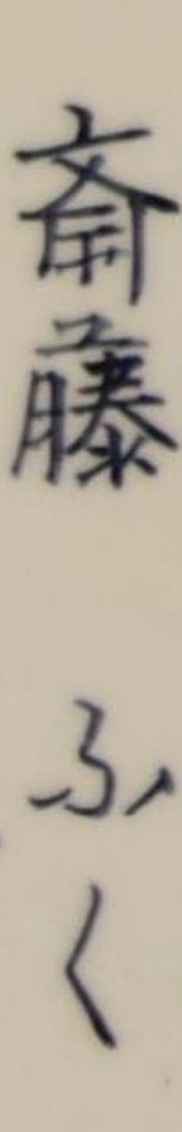斎藤ふく
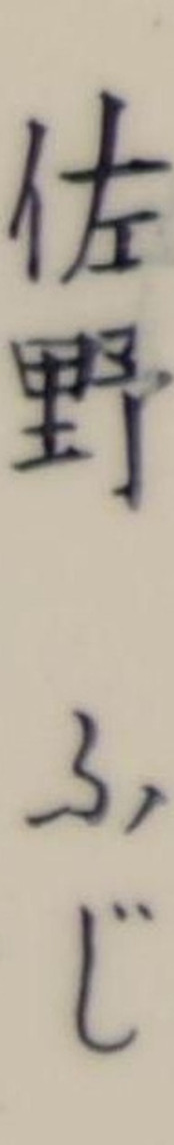佐野ふじ
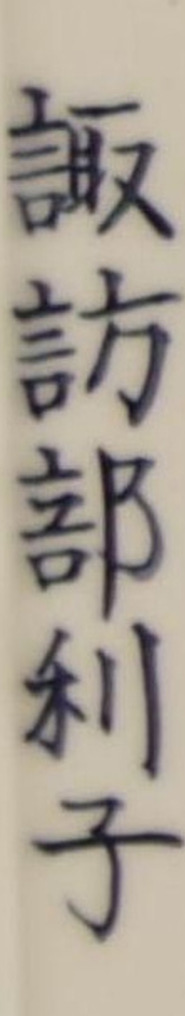諏訪部利子

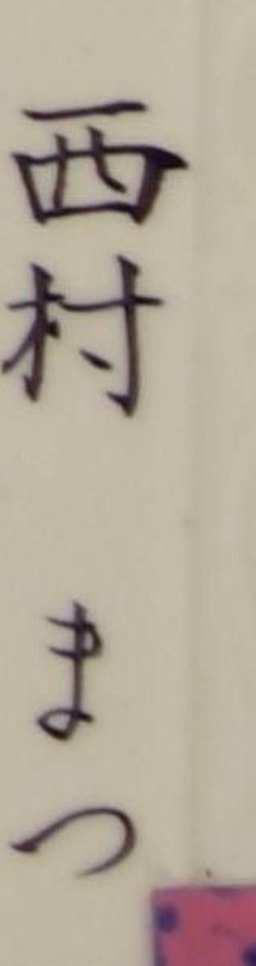西村まつ
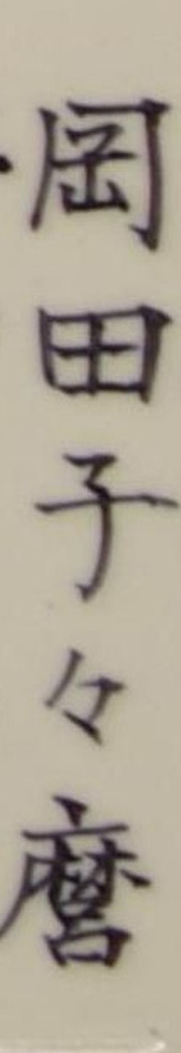岡田子々麿
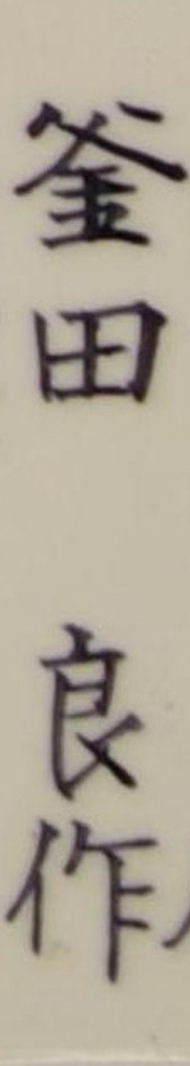釜田良作
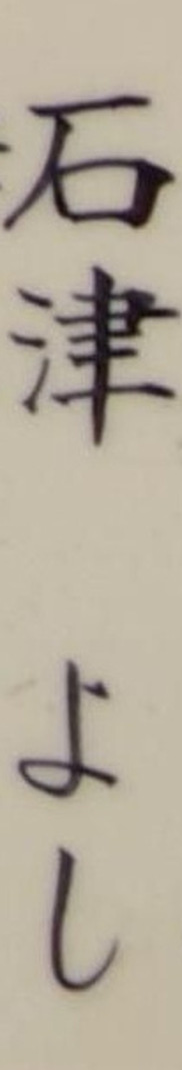石津よし
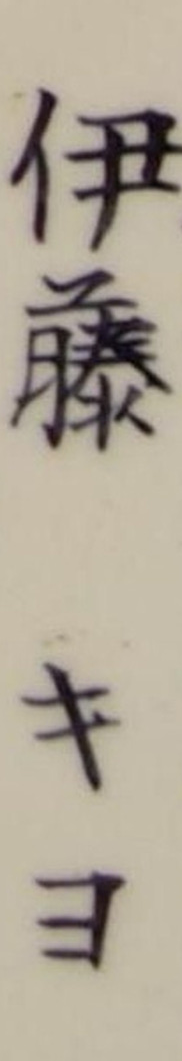伊藤キヨ
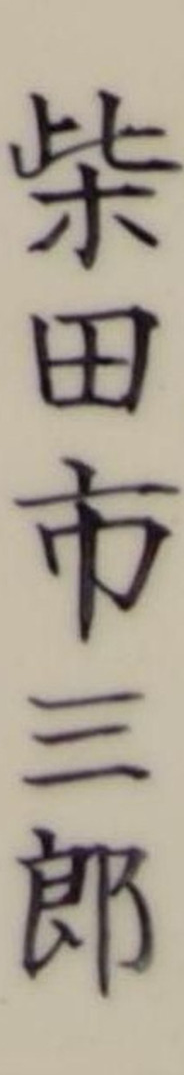柴田市三郎
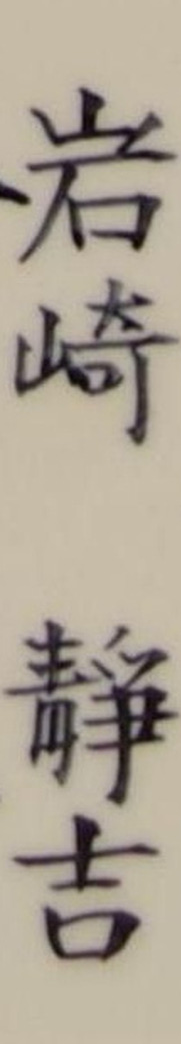岩崎静吉
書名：M~S
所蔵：高野山金剛峯寺
